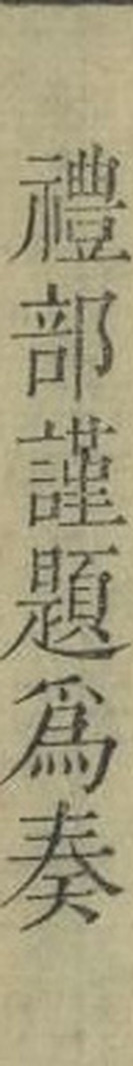禮部謹題爲奏
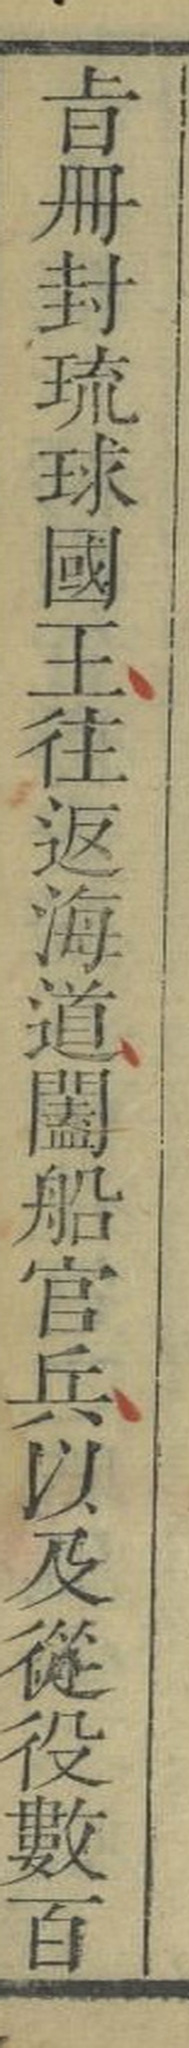㫖冊封琉球國王往返海道闔船官兵以及從役數百

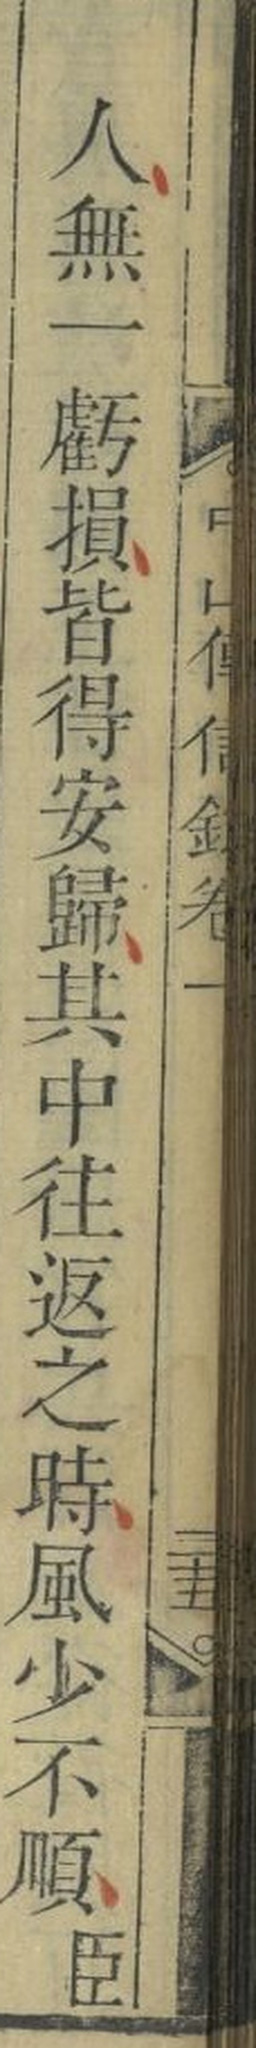人無一虧損皆得安歸其中往返之時風少不順臣
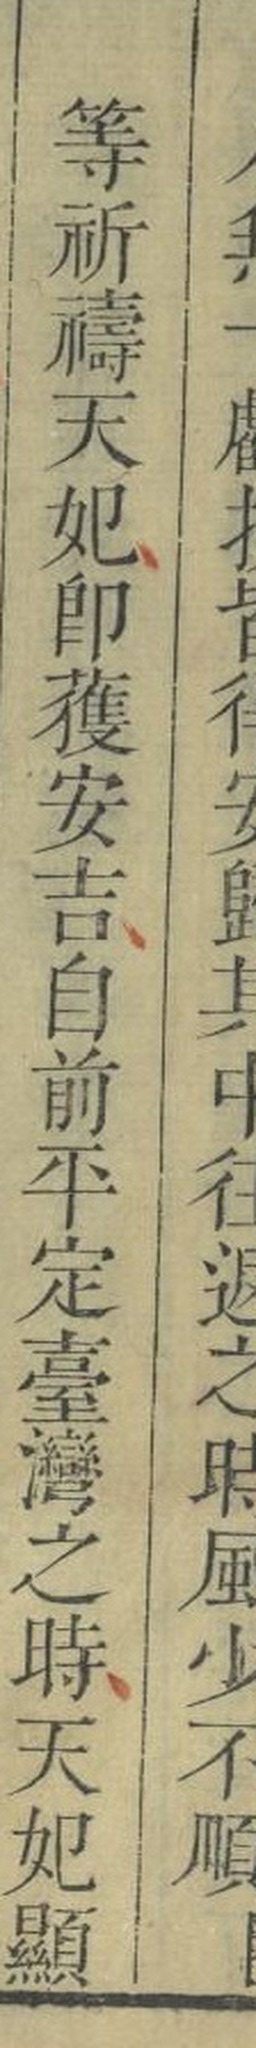等祈禱天妃卽獲安吉自前平定臺灣之時天妃顯
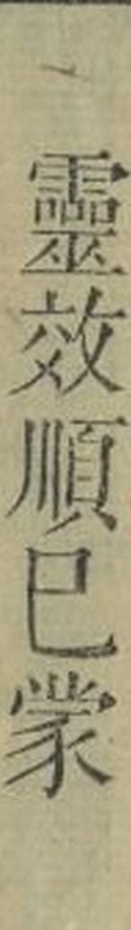靈效順巳蒙
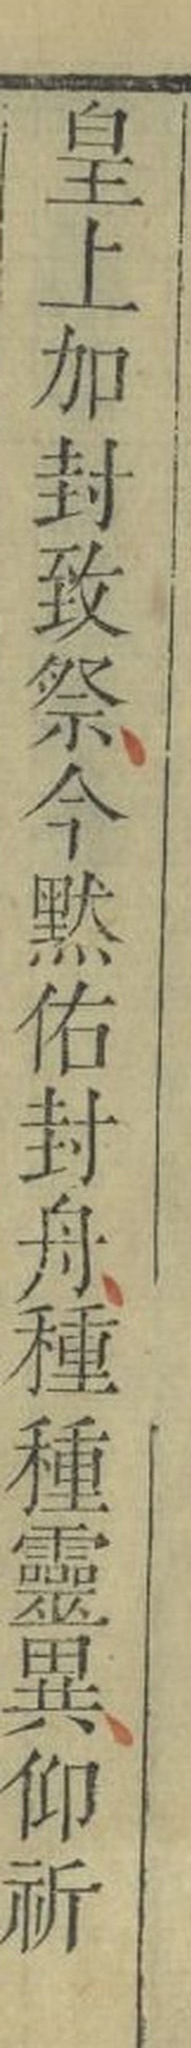皇上加封致祭今默佑封舟種種靈異仰祈
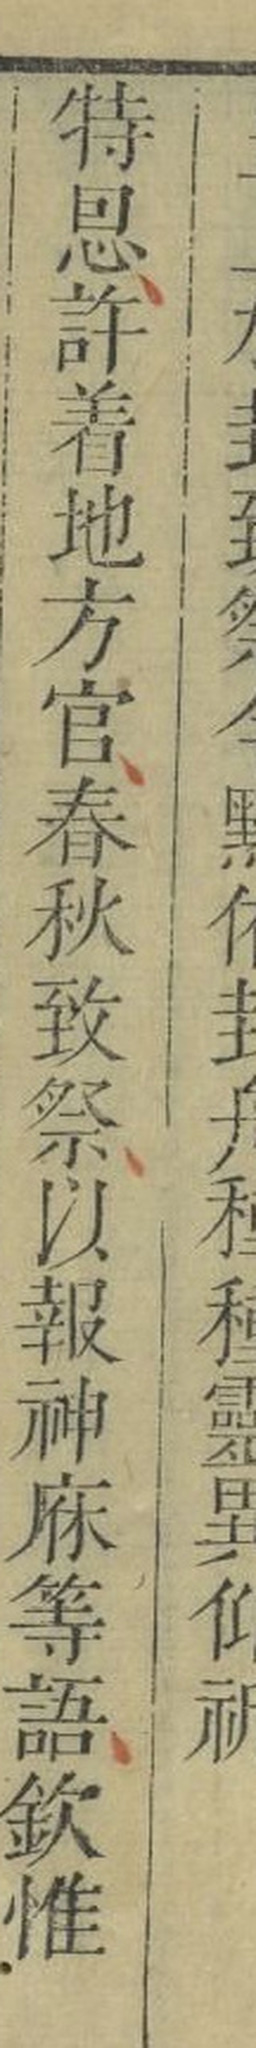特㤙許着地方官春秋致祭以報神庥等語欽惟
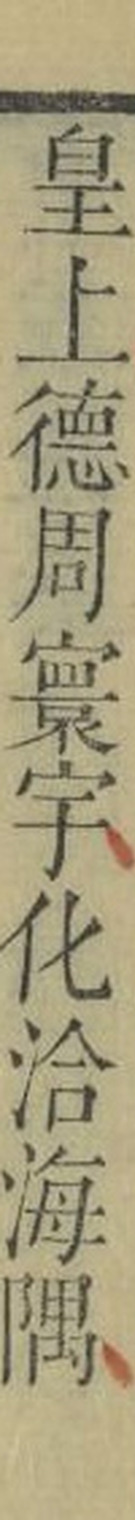皇上德周寰宇化洽海隅
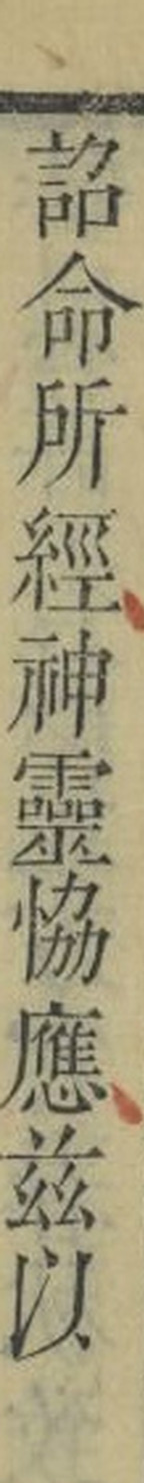詔命所經神靈恊應茲以
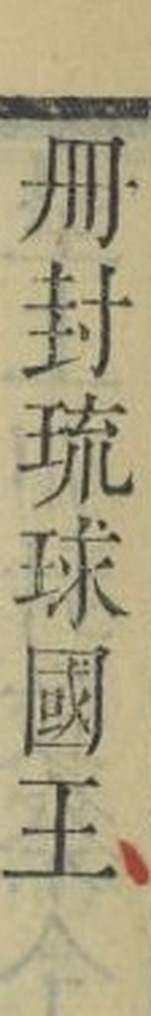冊封琉球國王
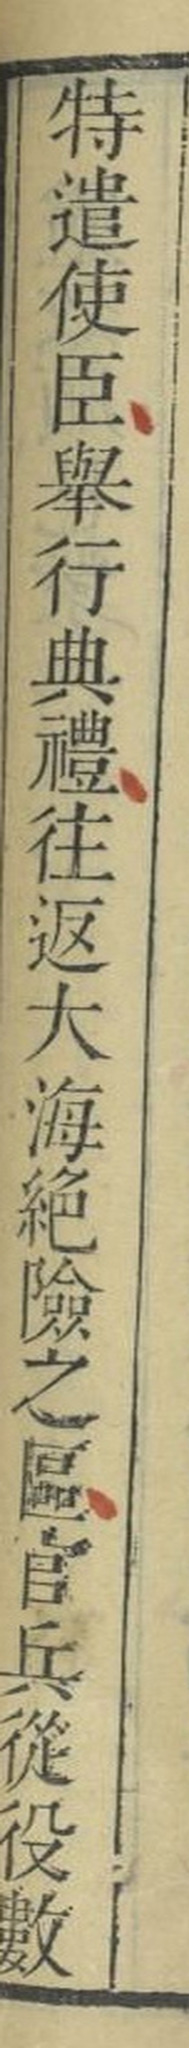特遣使臣舉行典禮往返大海絶險之區官兵從役數
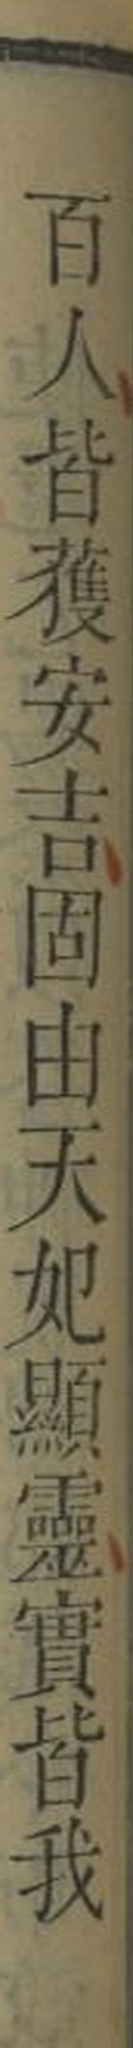百人皆獲安吉固由天妃顯靈實皆我
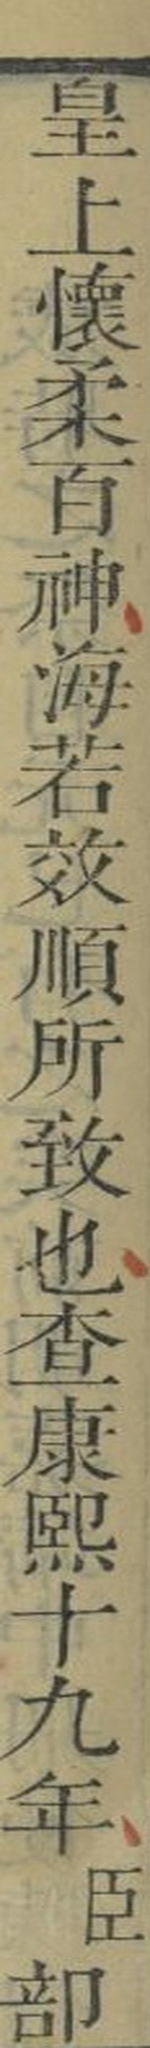皇上懷柔百神海若效順所致也查康熙十九年臣部
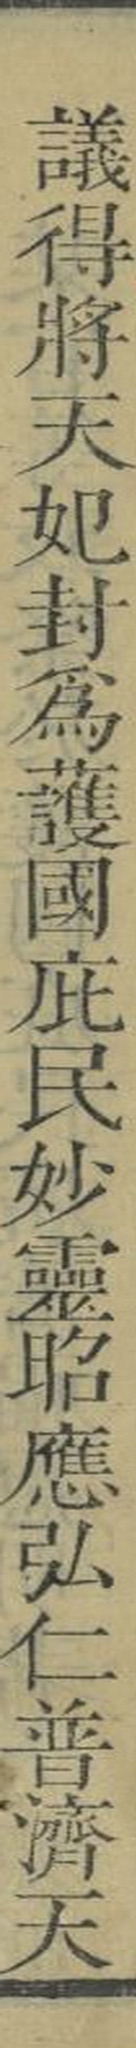議得將天妃封爲䕶國庇民妙靈昭應弘仁普濟天
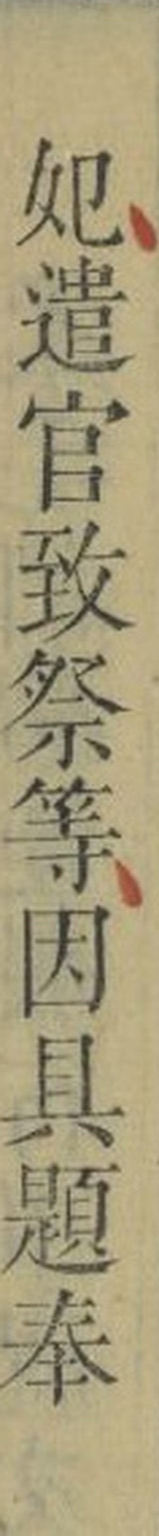妃遣官致祭等因具題奉
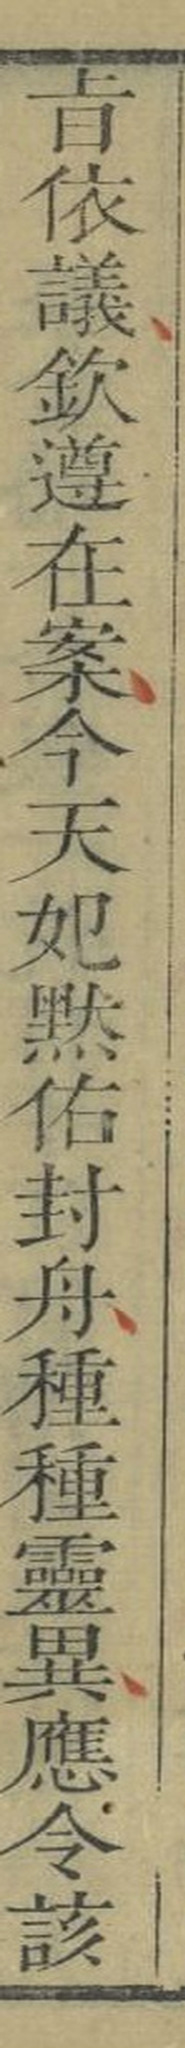㫖依議欽遵在案今天妃默佑封舟種種靈異應令該
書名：中山伝信録 巻一、巻二
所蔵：University of the Ryukyus Library
